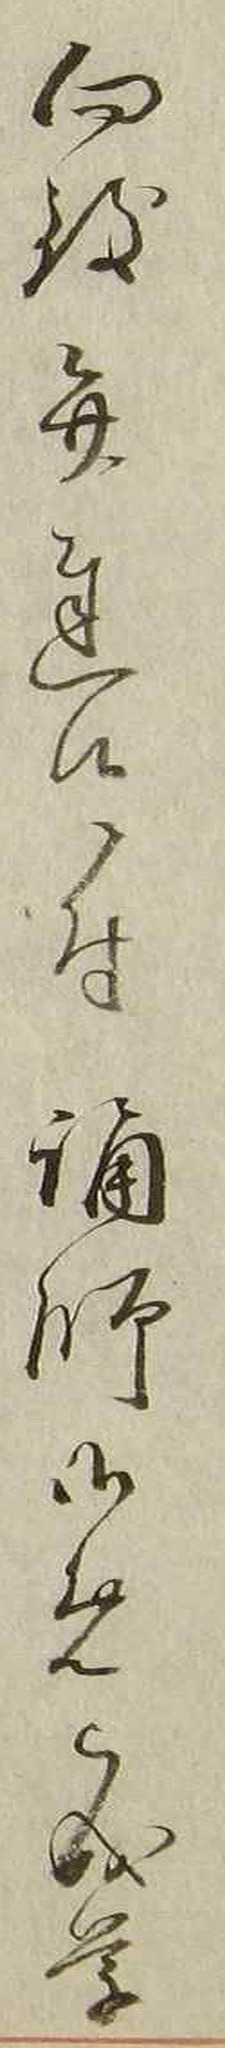向致弁達候ニ付誦師御免被成学
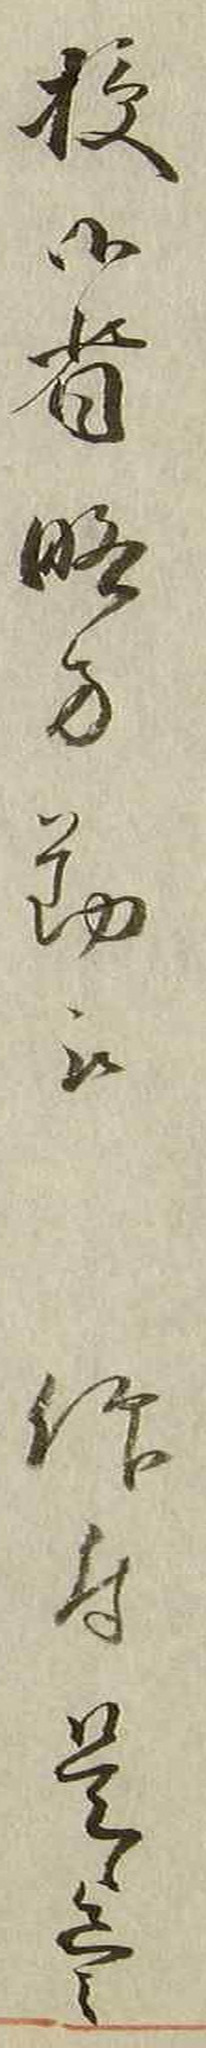校御省略方勤被仰付是迄之
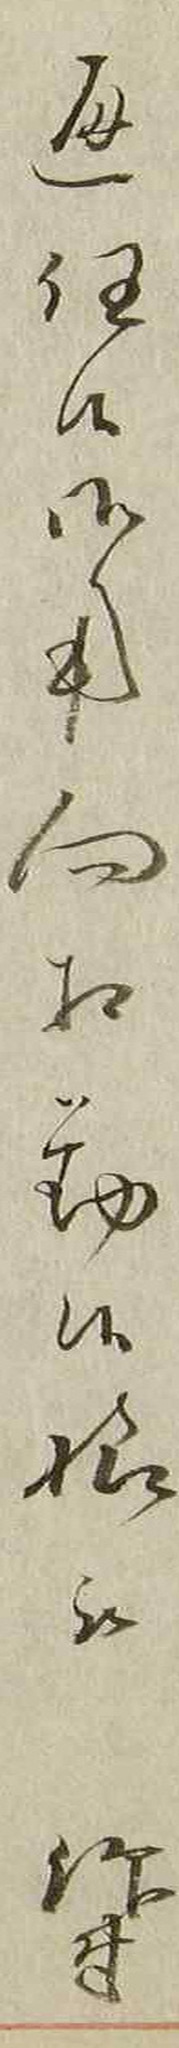通任候御用向相勤候様被仰付
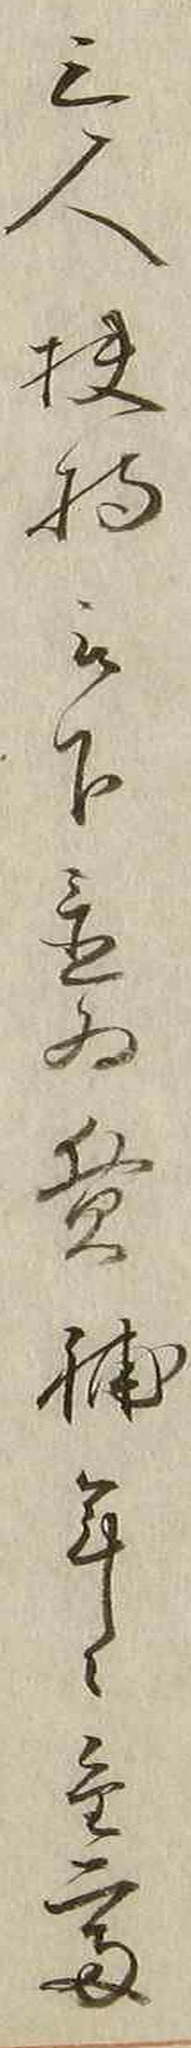三人扶持被下置為費補年々金二両
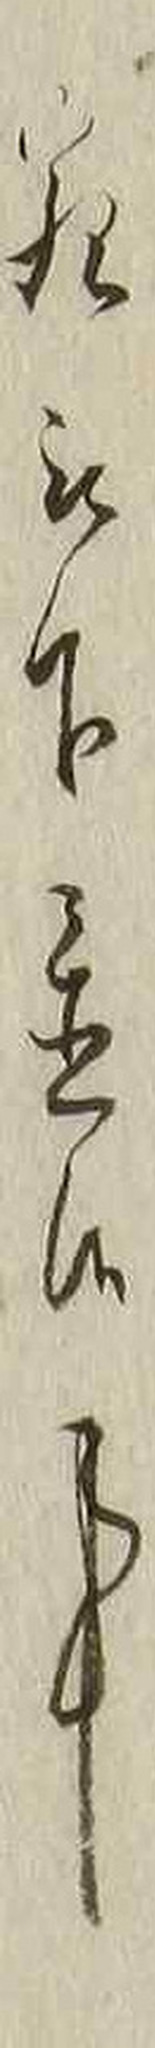被下置候事
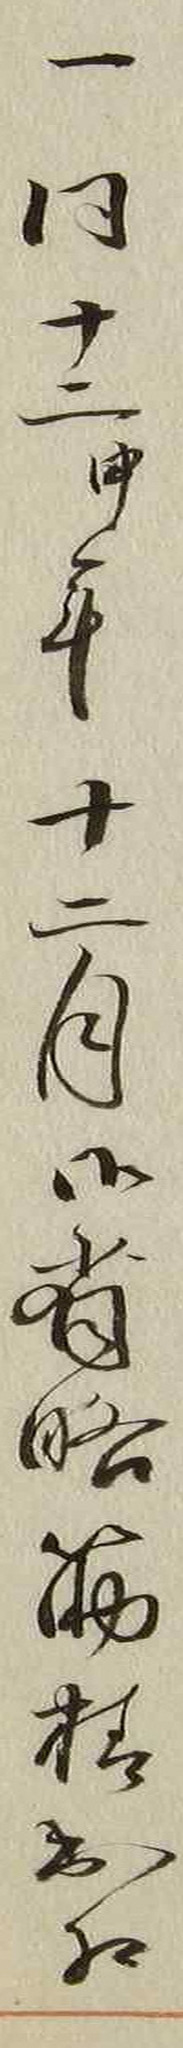一同十二申年十二月御省略筋精出相
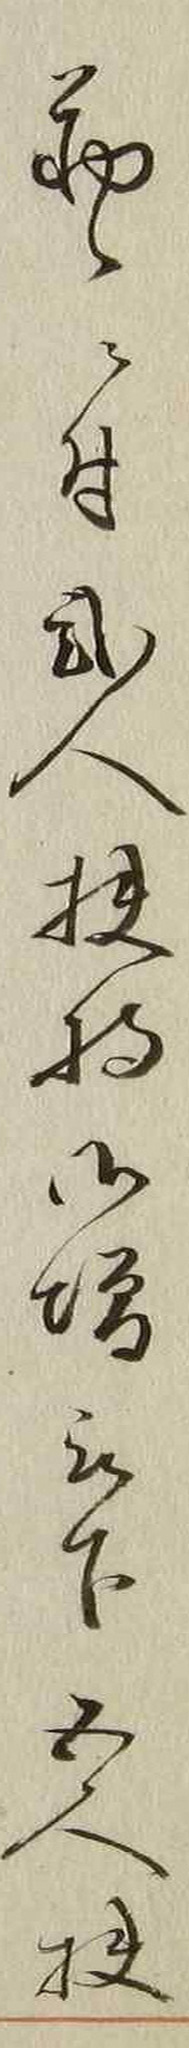勤候ニ付弐人扶将御増被下五人扶
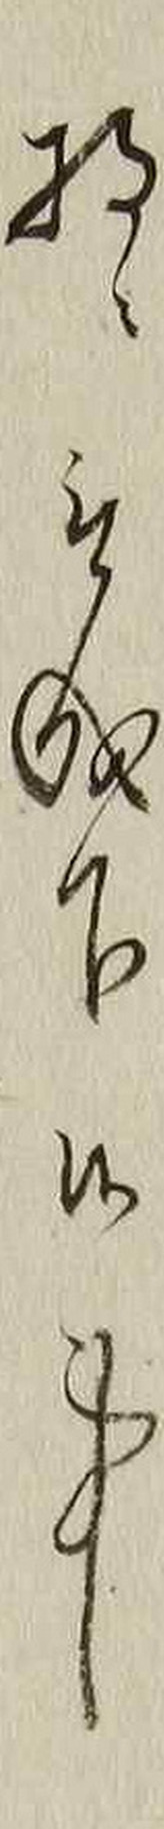持被成下候事
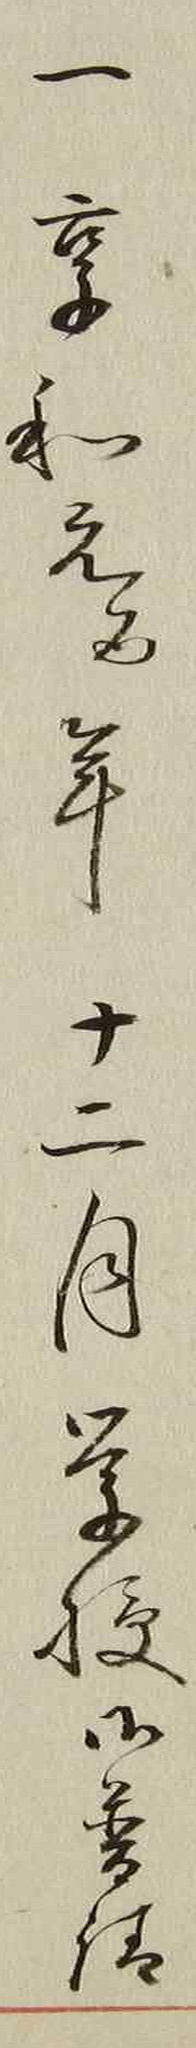一享和元酉年十二月学校御普請
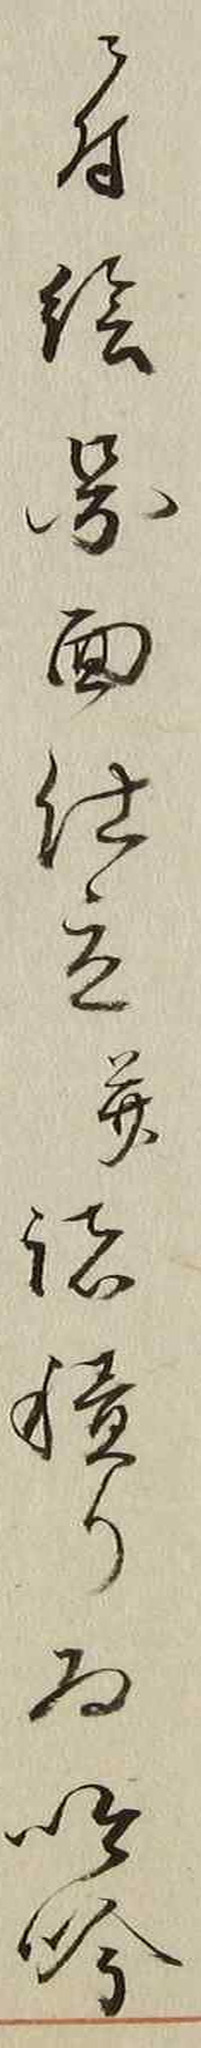ニ付絵図面仕立并諸積り為吟吟
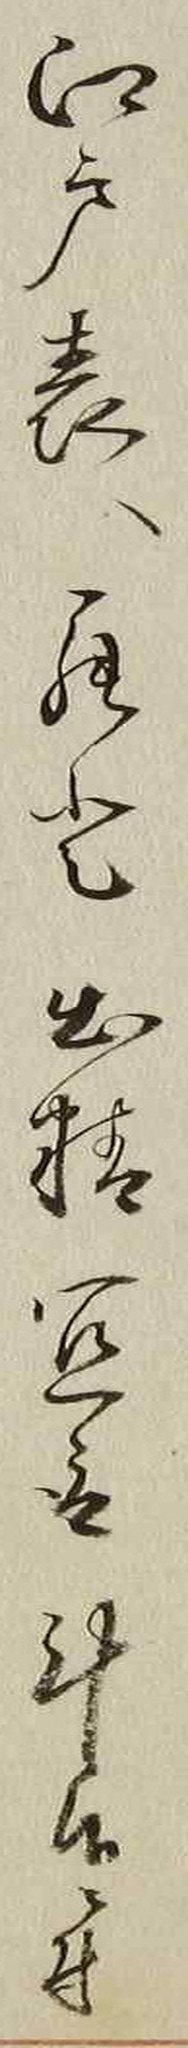江戸表へ罷登出精宜取計候ニ付
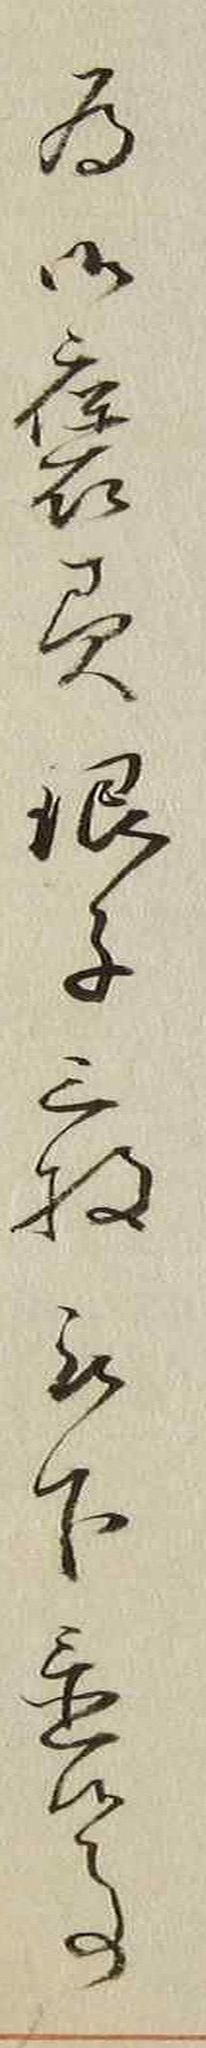為御褒美銀子三枚被下置候事
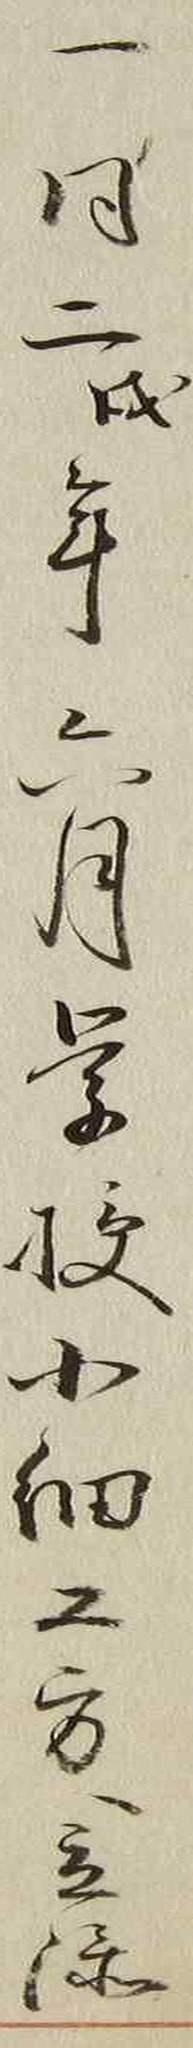一同二戌年六月学校小細工方へ立添
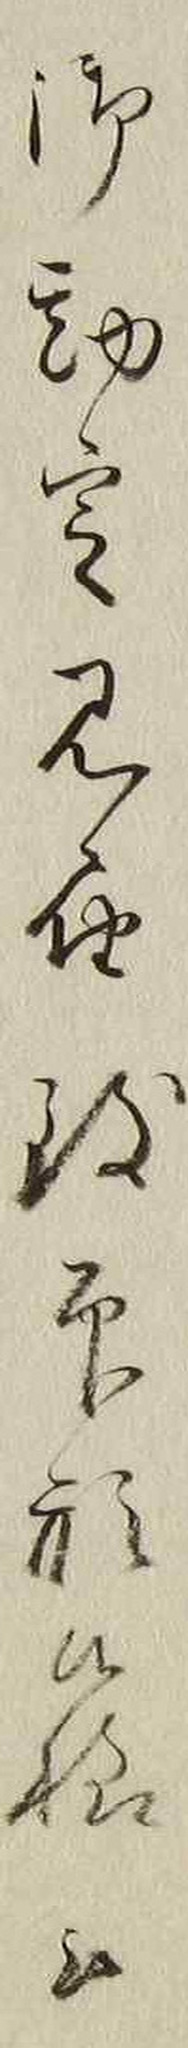御勘定見届致印形候様被
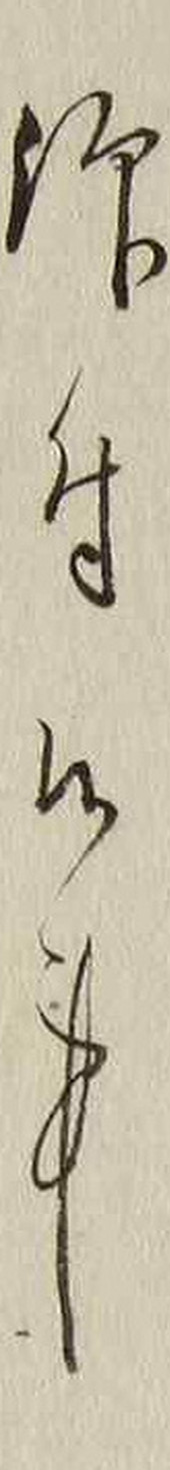仰付候事
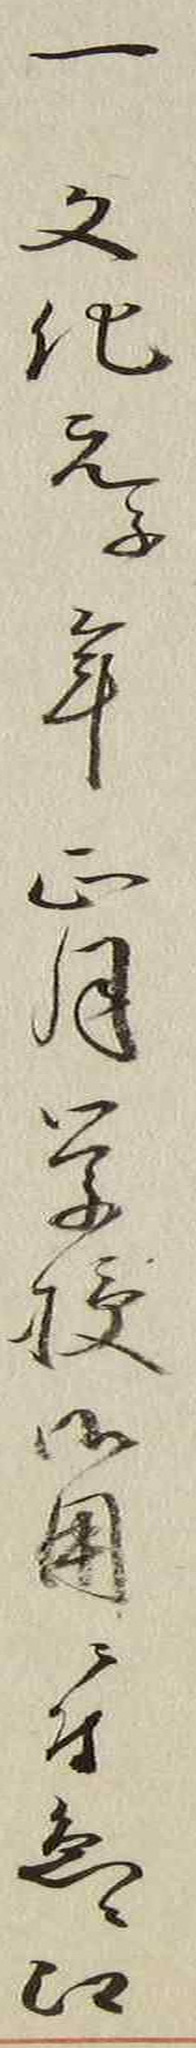一文化元子年正月学校御用ニ付急ニ江
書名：諸士系譜　巻之28　い之部28
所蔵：会津若松市立会津図書館
